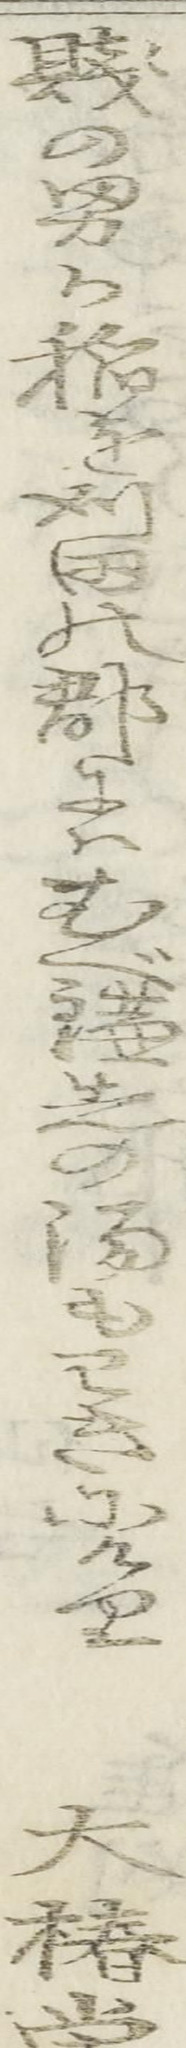賤の男か稲を刈田の郡にはむべ鎌先の湯もわきにけり古川大椿堂
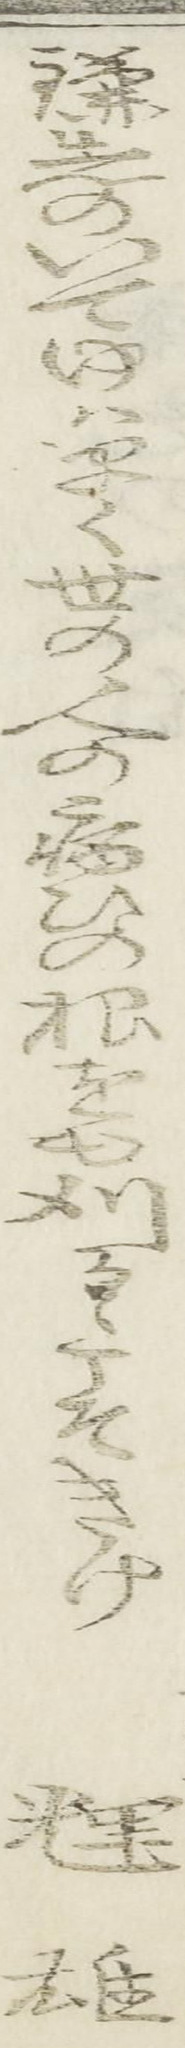鎌先のいてゆは早く世の人の病ひの根をも刈るゝこそきけ東京輝雄
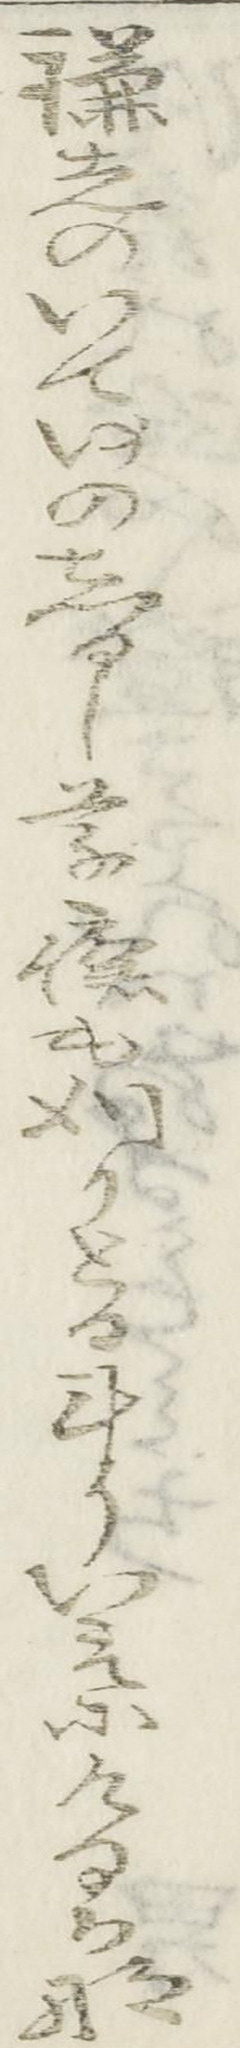鎌先のいてゆのしるし学鎌？も刈りとる計りいえにけるかな延年
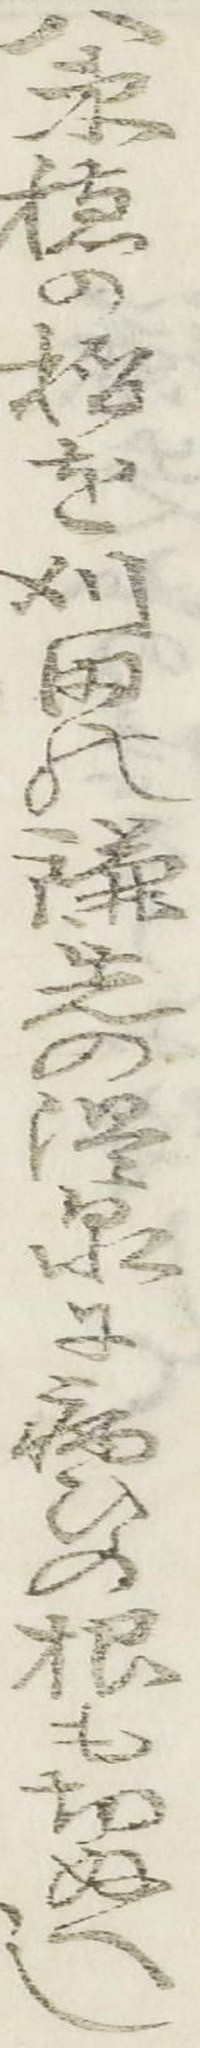八束穂の稲を刈田の鎌先の温泉に病ひの根も切ぬへし肖杉

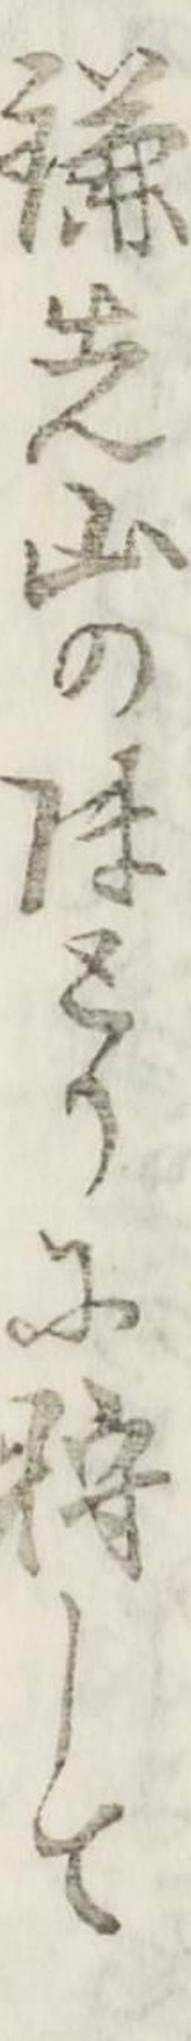鎌先山のほとりに狩して
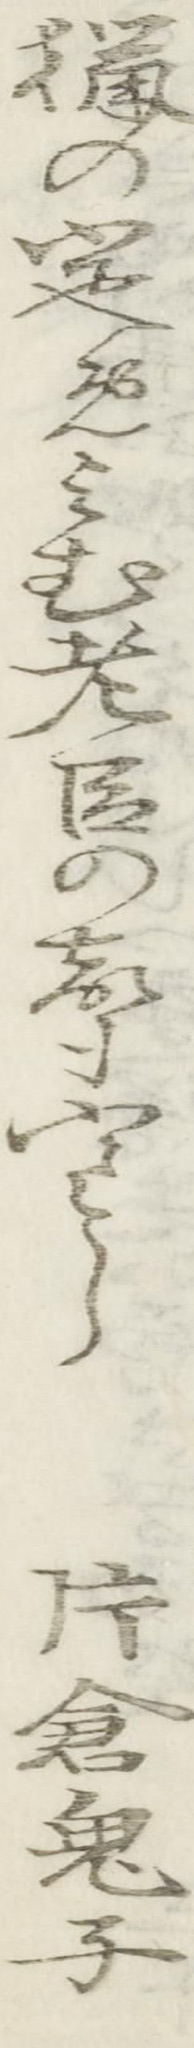猟の定めみむ老臣の声寒し白石片倉鬼子
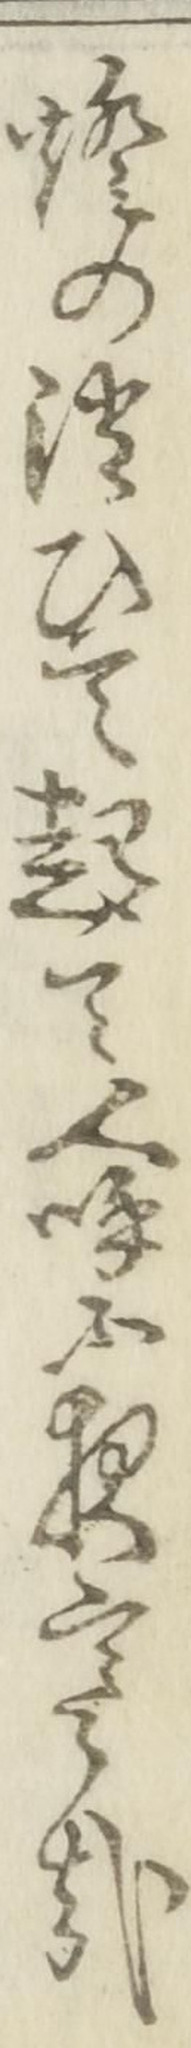燈の消ひて起て人呼ふ夜寒哉仝
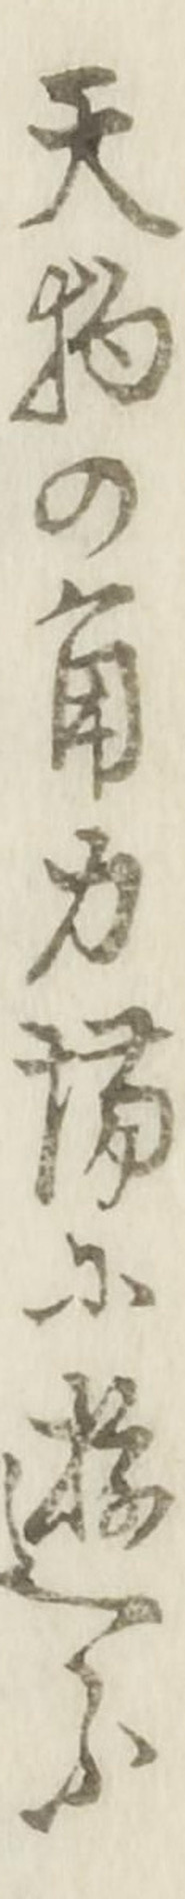天狗の角力場に遊ふ
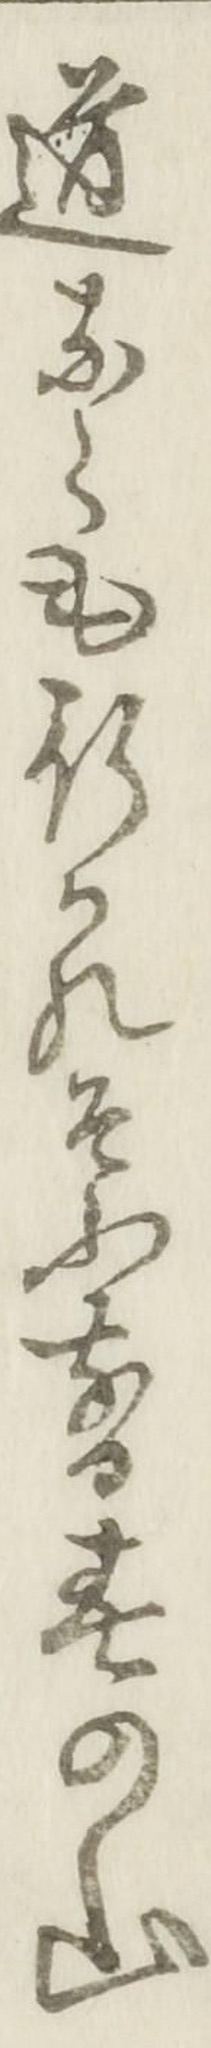道なくも行かれそふなる春の山仝

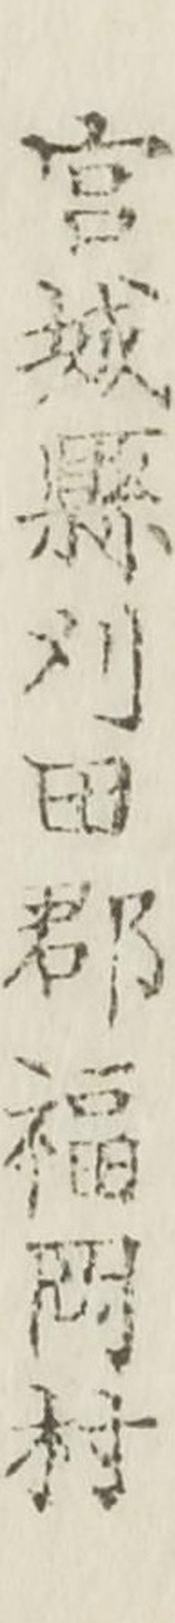宮城県刈田郡福岡村
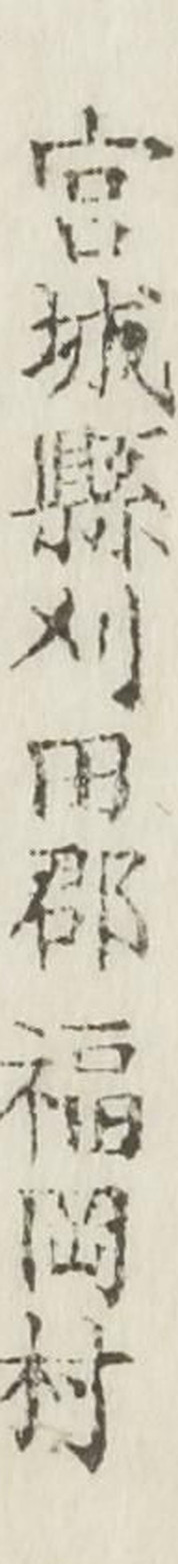宮城県刈田郡福岡村
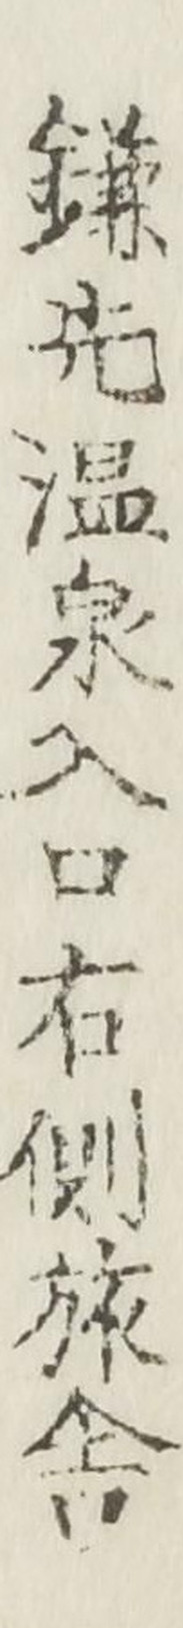鎌先温泉入口右側旅舎
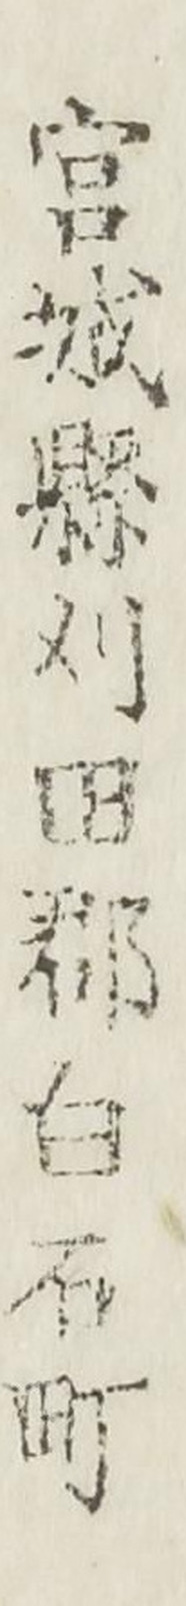宮城県刈田郡白石町
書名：鎌先温泉由來記
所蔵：東京大学地震研究所図書室 Earthquake Research Institute Library, The University of Tokyo, JAPAN
